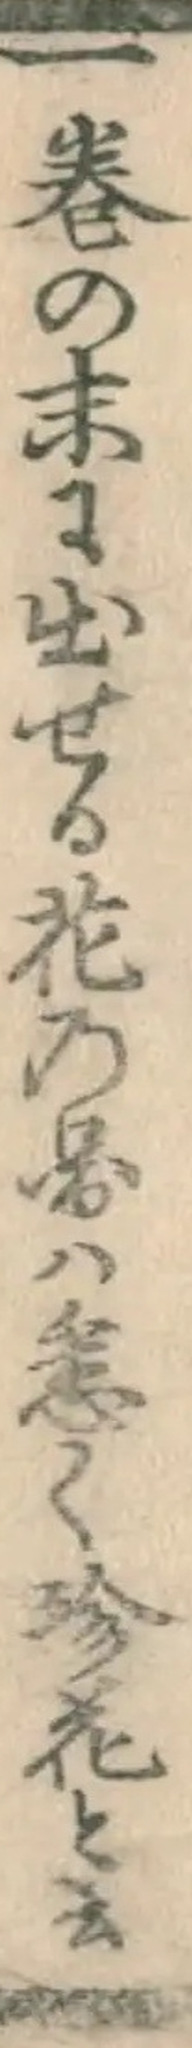一巻の末に出せる花の図は悉く珍花と云
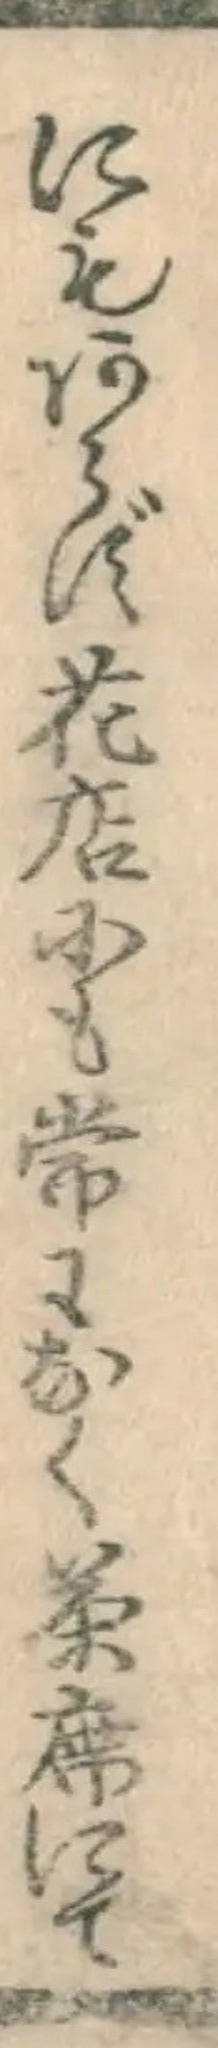にもあらず花店にも常になく茶席にて
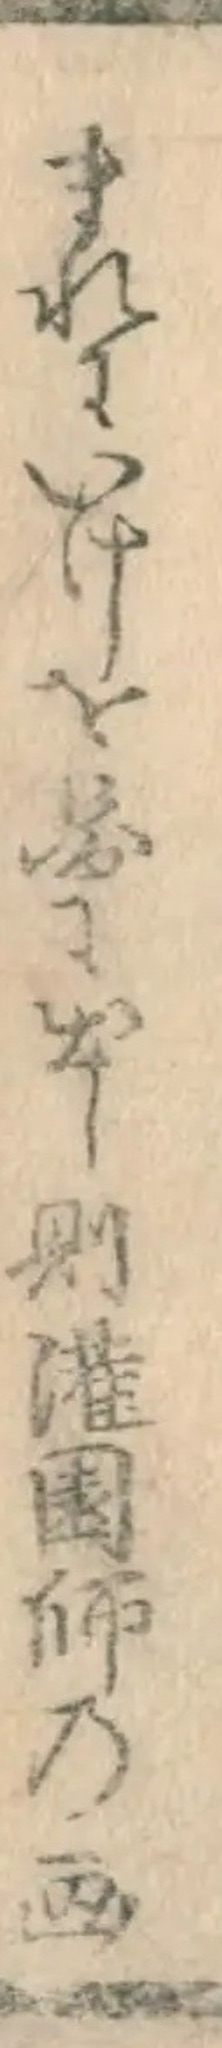まれにいけしを図に出し則潅園師の画
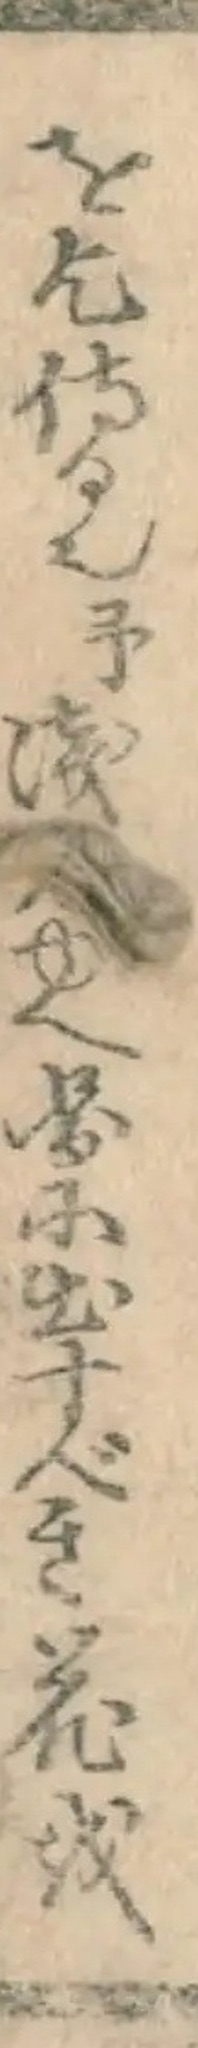を尤伝る也予浅ゆへ図に出すべき花を

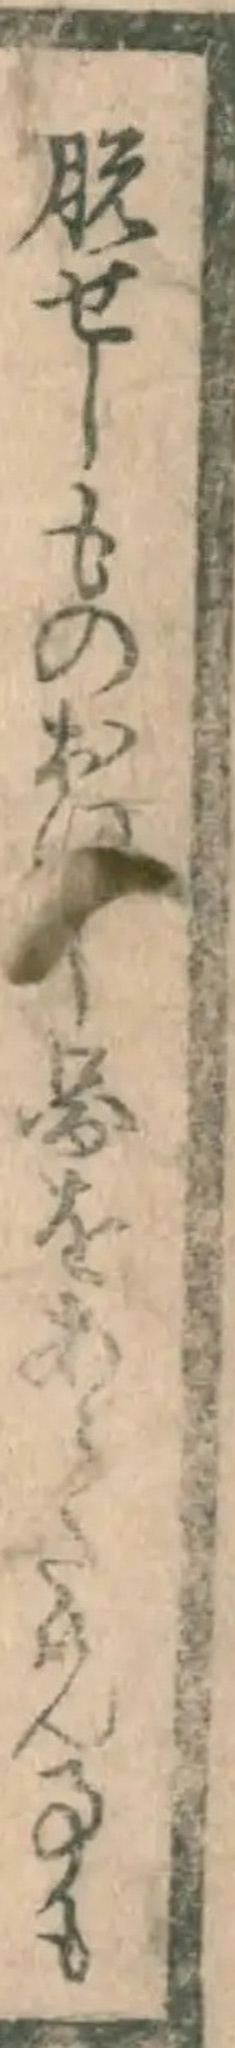脱せしものおし図をあらたん事も
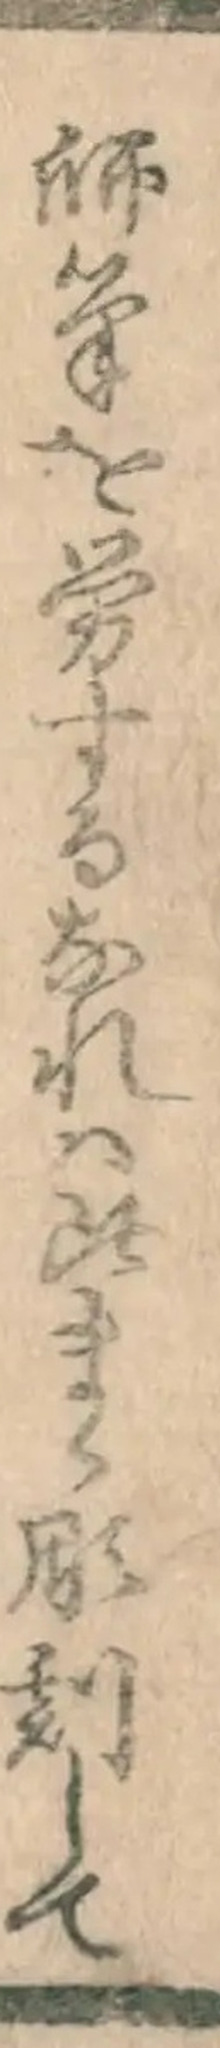師筆を労するなれは此まゝ彫刻して
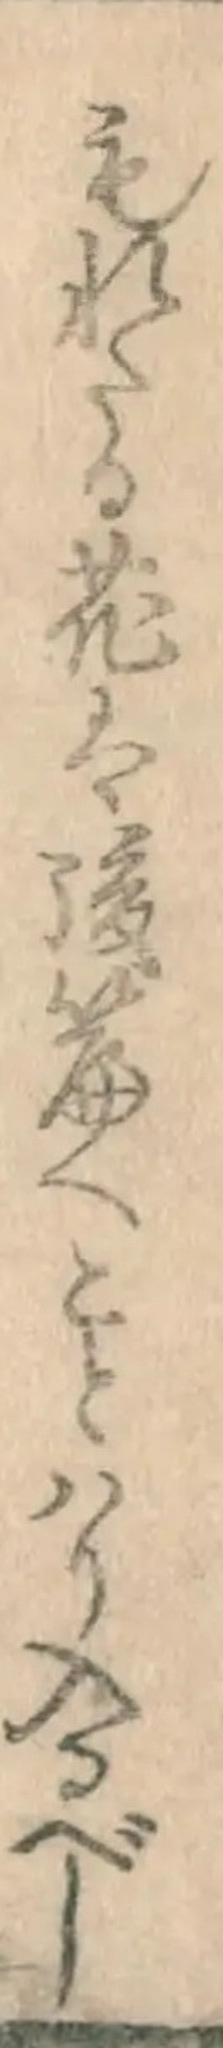もれたる花は後篇へことはり入るべし
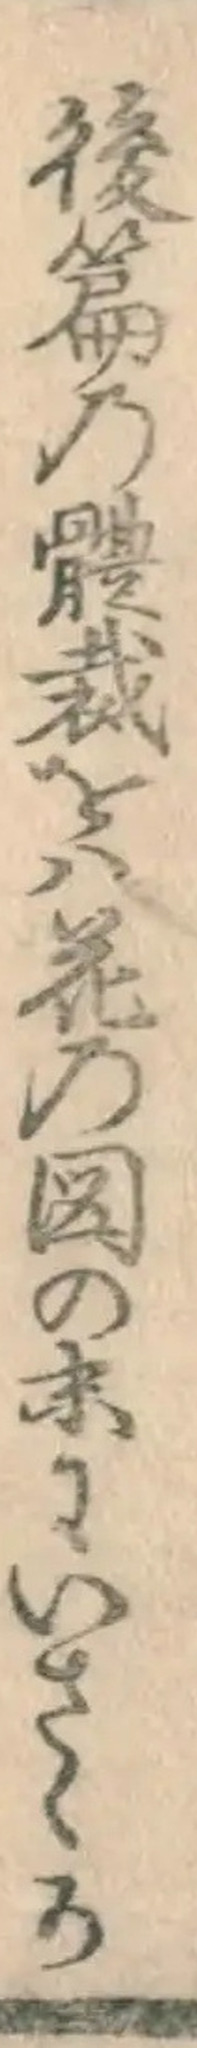後篇の体裁をは花の図の末にいさゝか
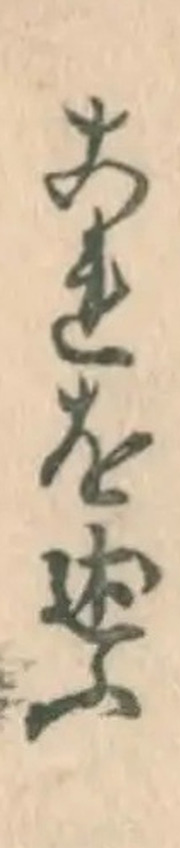これを述ふ

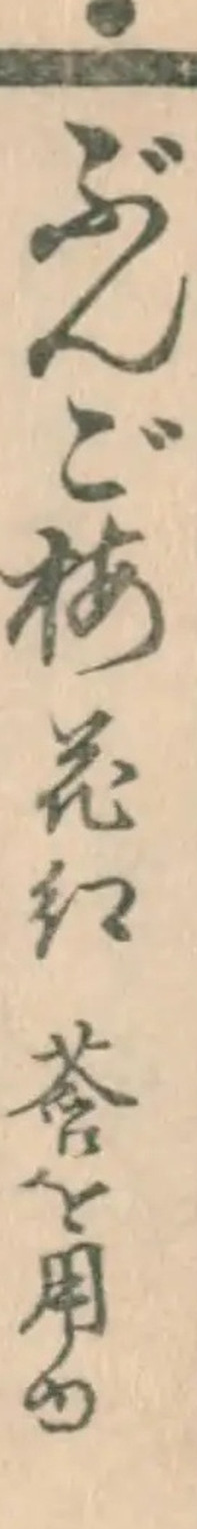●ぶんご梅花紅莟を用ゆ
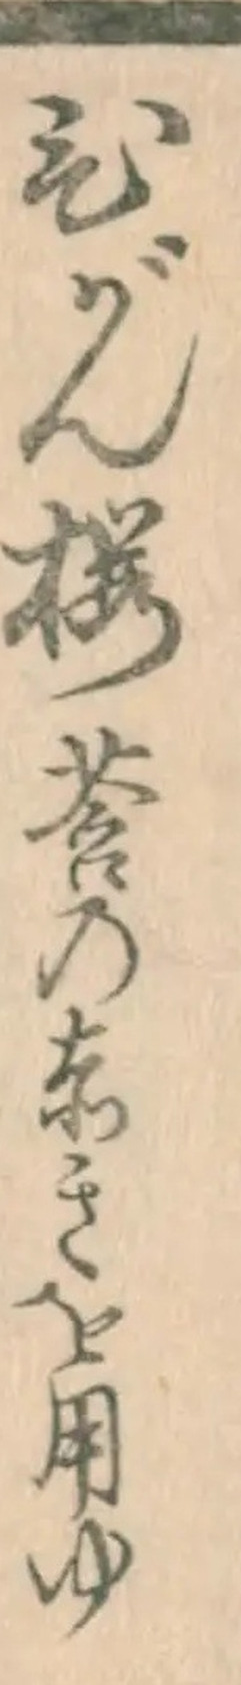ひがん桜莟の赤きを用ゆ
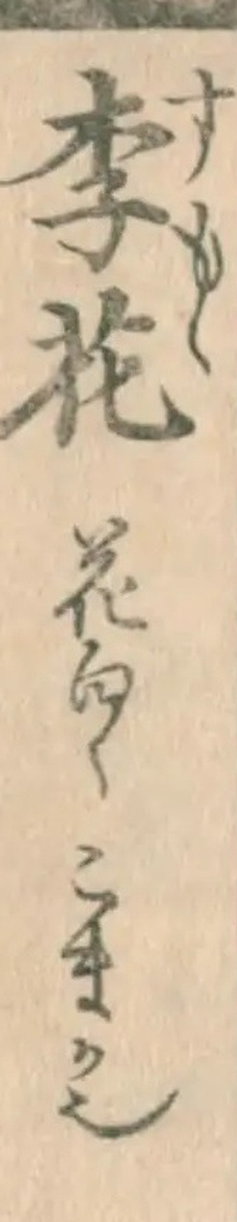李花花白くこまか也

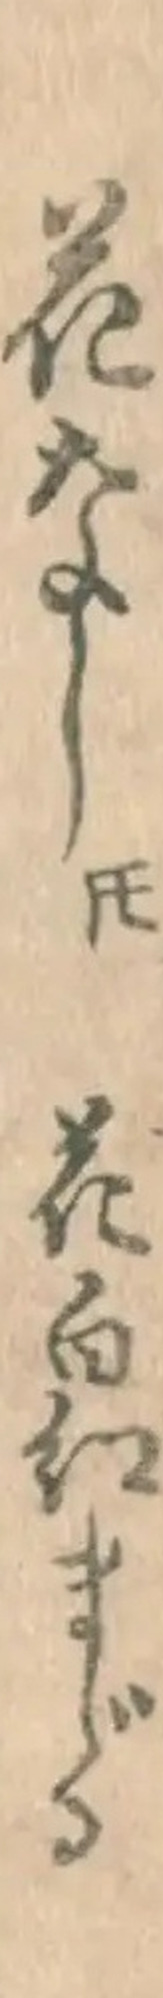花なしトモ花白紅まじる
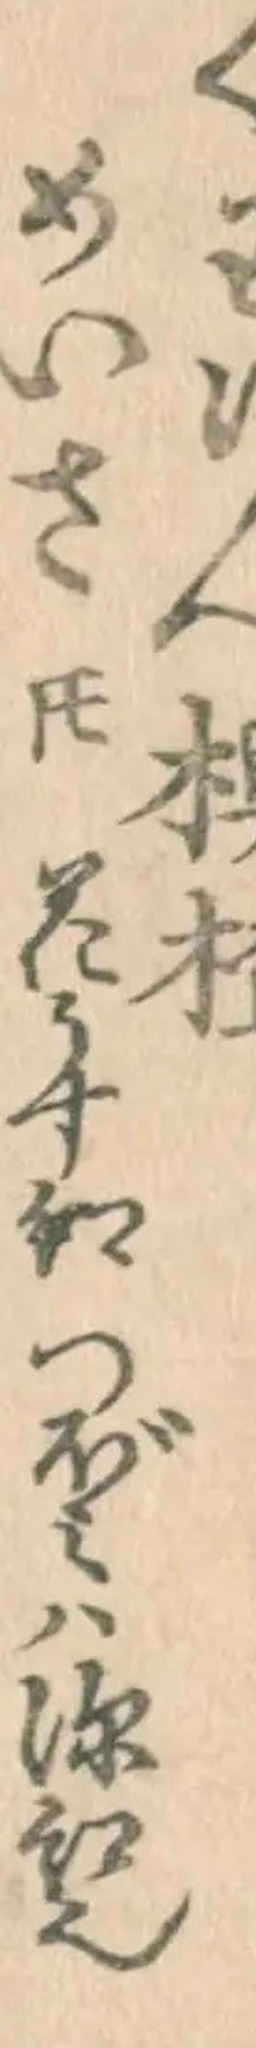めいさトモ花うす紅つぼみは深紅也
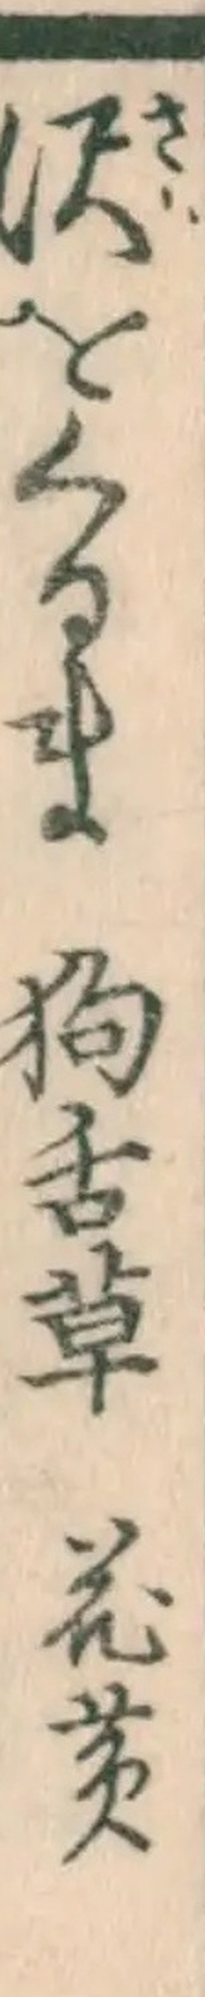沢をくるま狗舌草花黄
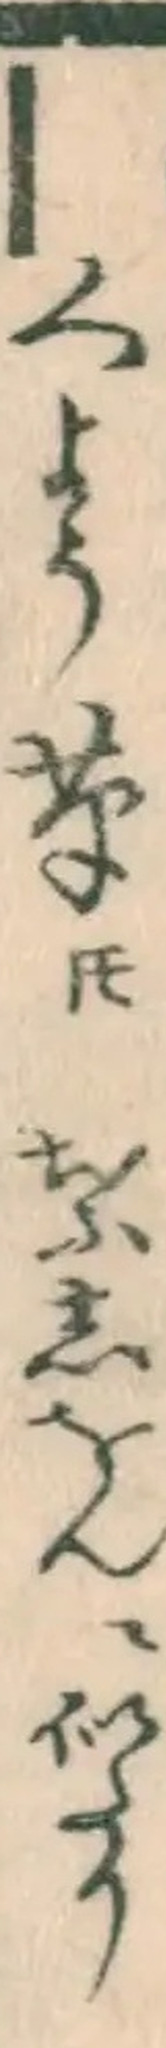❙くよう草トモ葉しをんに似たり
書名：茶席挿花集
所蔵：国立国会図書館 National Diet Library, JAPAN
